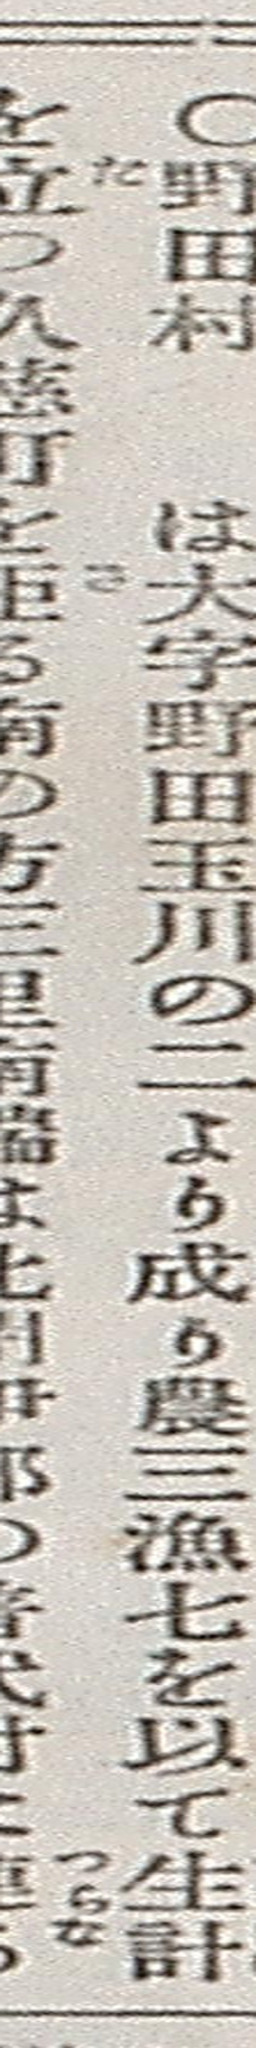を立つ久慈町を距る南の方三里南端は北閉伊郡の普代村に連る
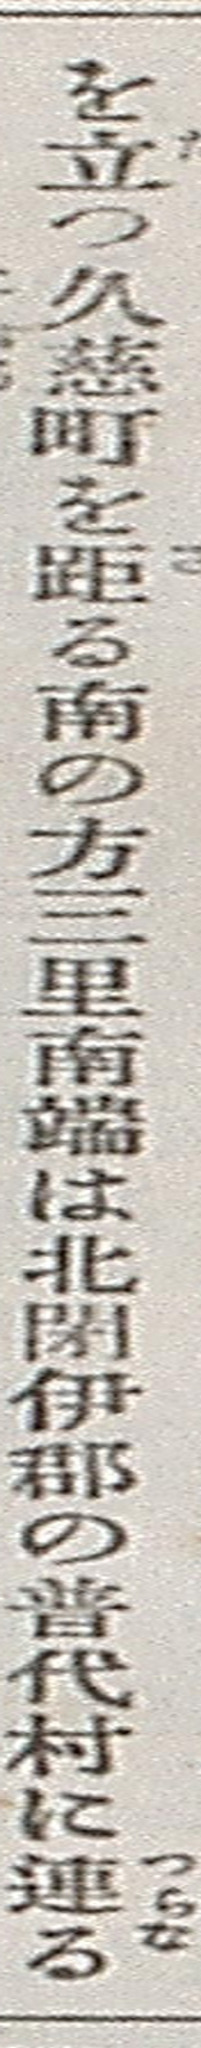を立つ久慈町を距る南の方三里南端は北閉伊郡の普代村に連る
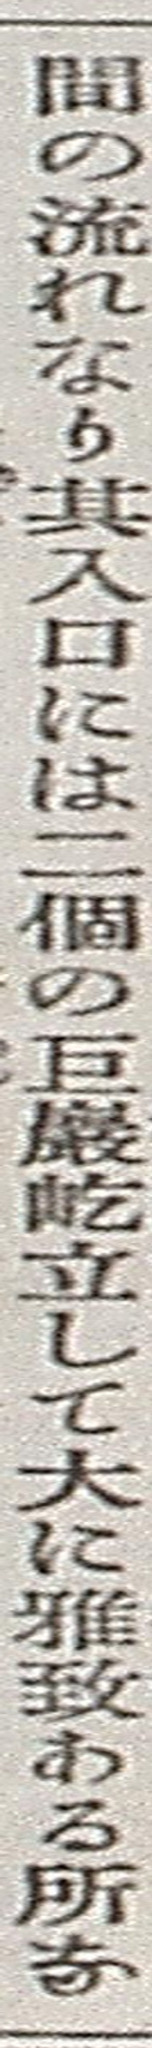間の流れなり其入口には二個の巨巌屹立して大に雅致ある所な
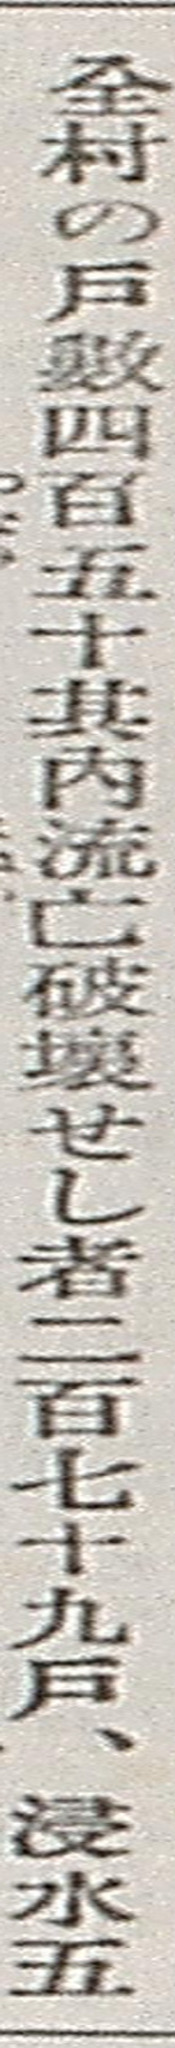全村の戸数四百五十其内流亡破壊せし者ニ百七十九戸、浸水五
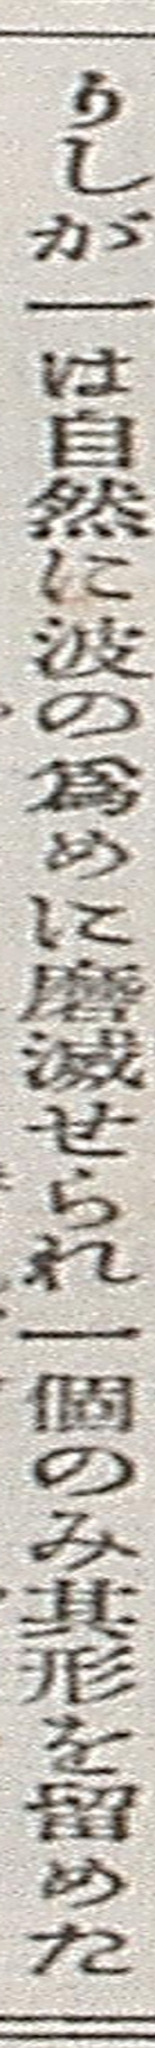りしが一は自然に波の為めに磨滅せられ一個のみ其形を留めた
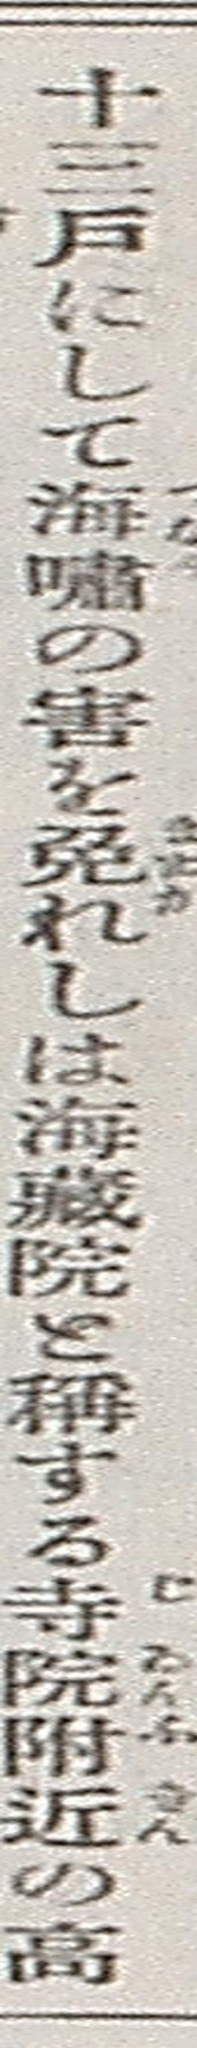十三戸にして海嘯の害を免れしは海蔵院と称する寺院付近の高
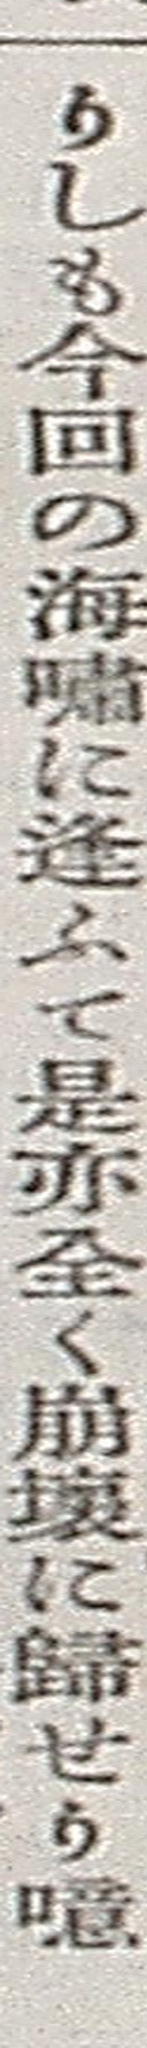りしも今回の海嘯に逢ふて是亦全く崩壊に帰せり噫
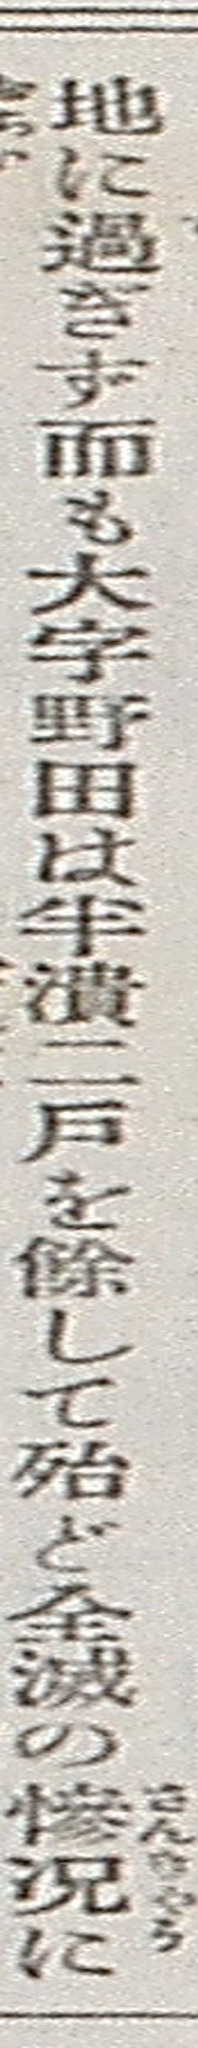地に過ぎず而も大字野田は半潰二戸を余して殆ど全滅の惨況に
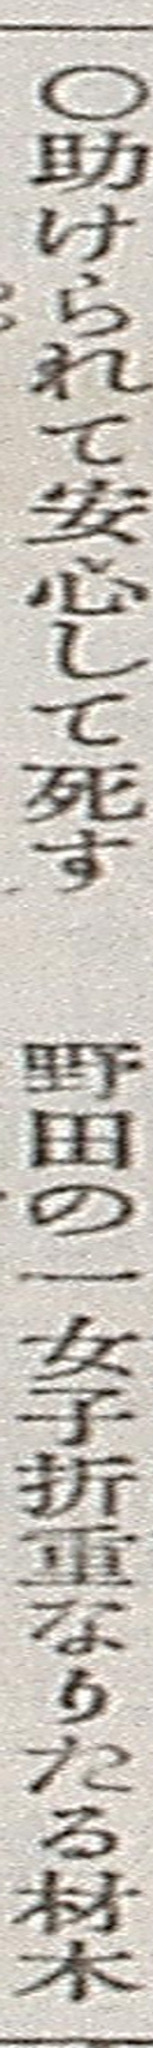○助けられて安心して死す野田の一女子折重なりたる材木
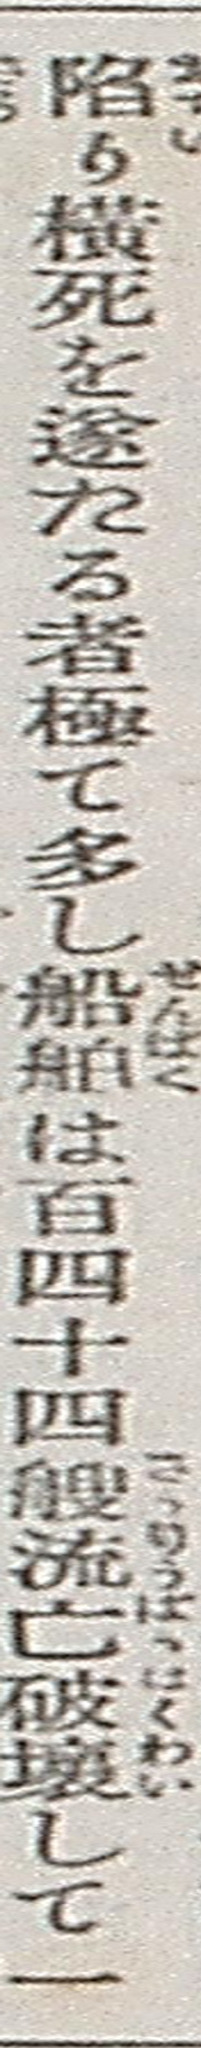陥り横死を遂たる者極て多し船舶は百四十四艘流亡破壊して一
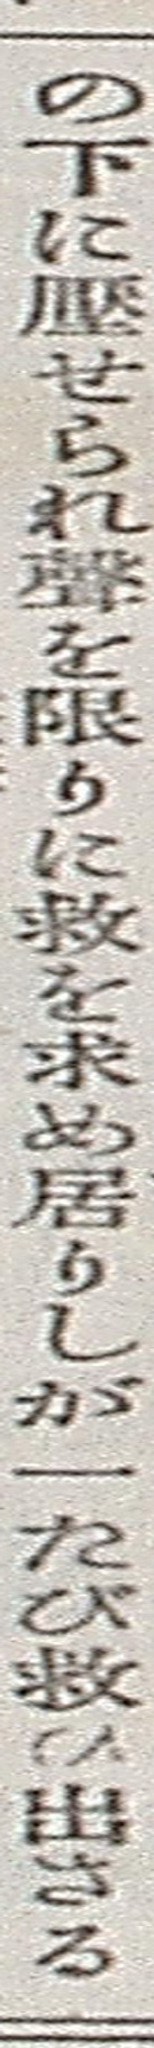の下に圧せられ声を限りに救を求め居りしが一たび救ひ出さる
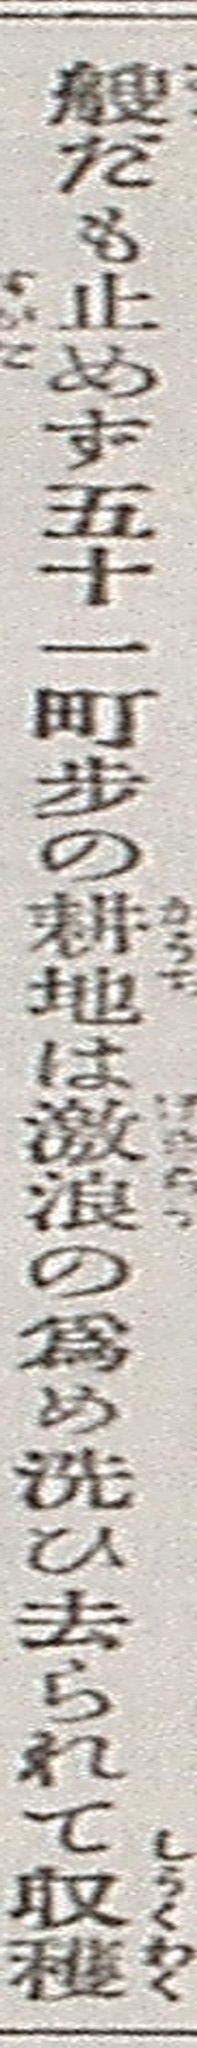艘だも止めず五十一町歩の耕地は激浪の為め洗ひ去られて収穫
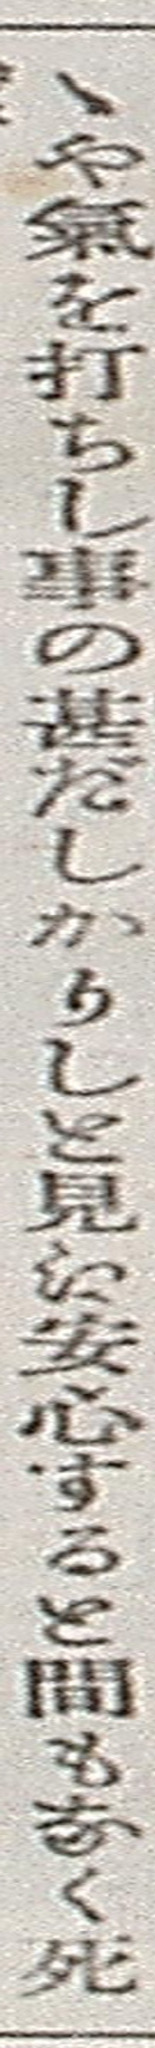ゝや気を打ちし事の甚だしかりしと見え安心すると間もなく死
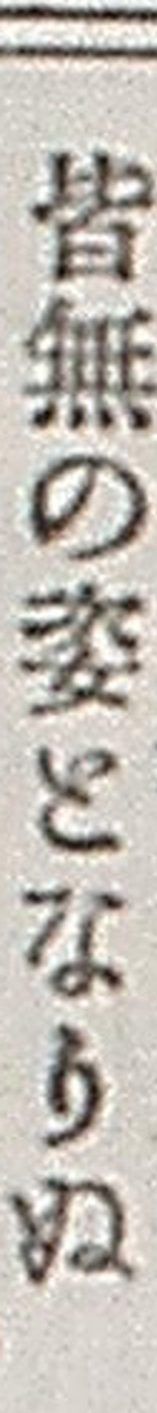皆無の姿となりぬ
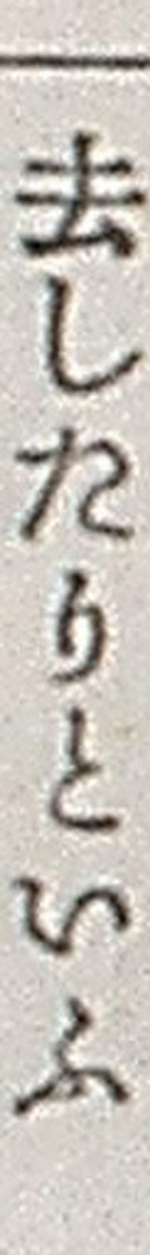去したりといふ
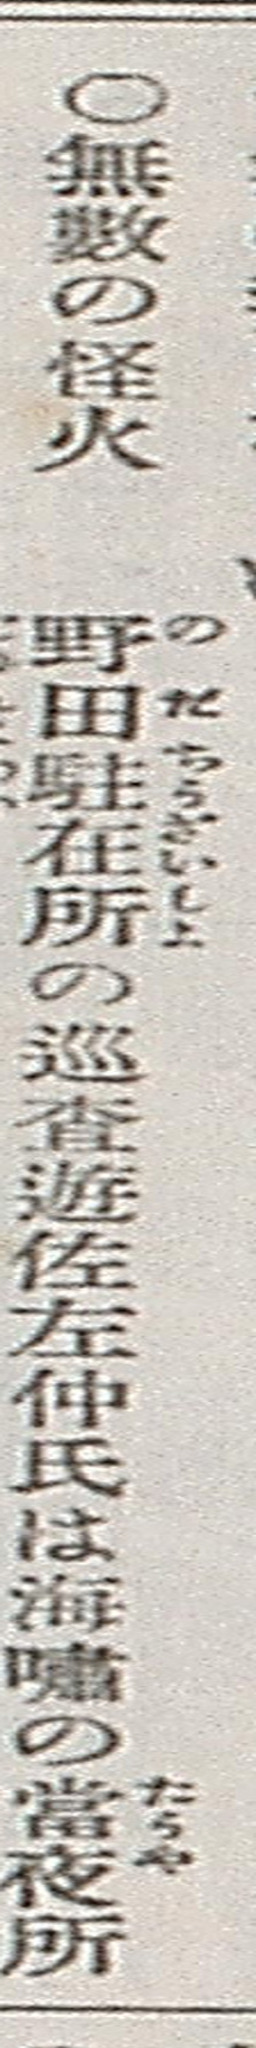○無数の怪火野田駐在所の巡査遊佐左仲氏は海嘯の当夜所
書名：風俗畫報臨時増刊第百二十號　大海嘯被害録（下）
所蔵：東京大学地震研究所図書室 Earthquake Research Institute Library, The University of Tokyo, JAPAN
